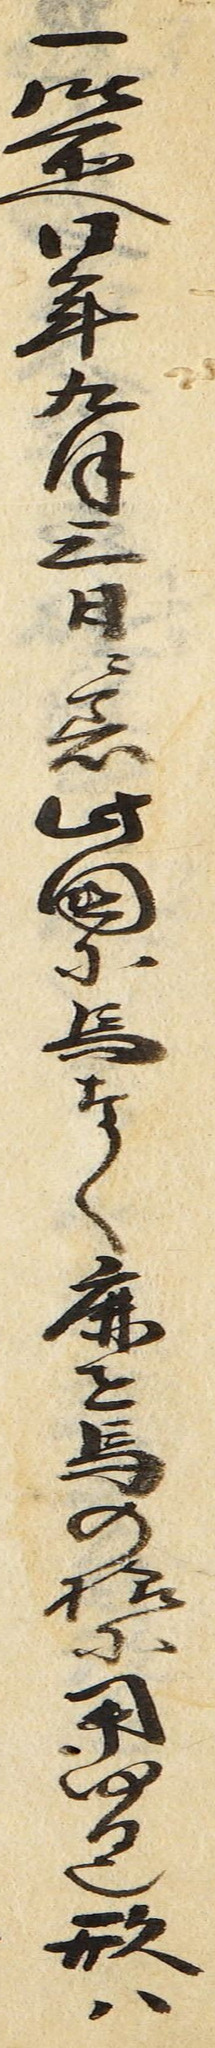一此所へ同年九月三日に着此国に馬なく鹿を馬の様に用ゆる也形は
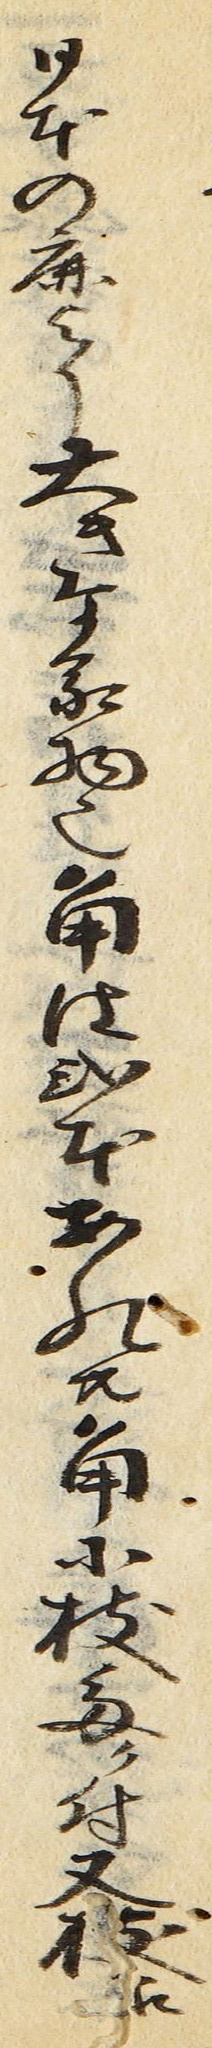日本の鹿より大きなる物也角は弐本あれ共角に小枝多く付又枝え
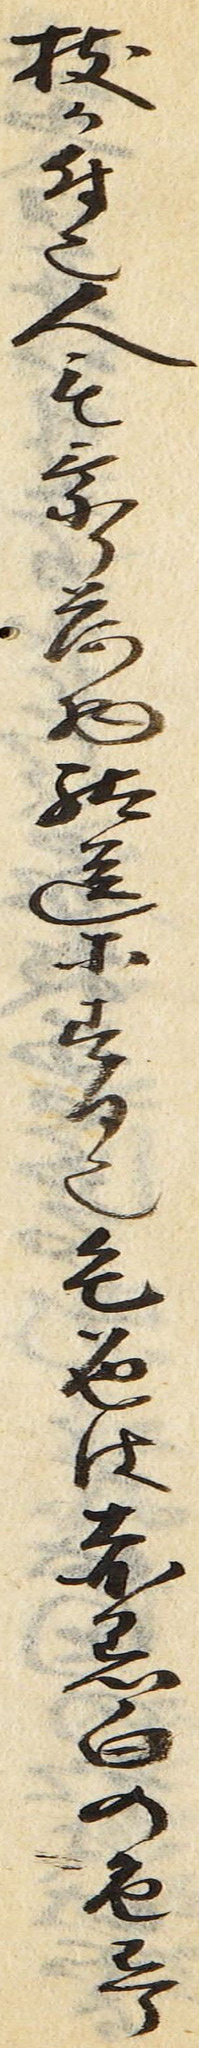枝か付也人も乗り荷物駄送等する也毛色赤黒白の色有り
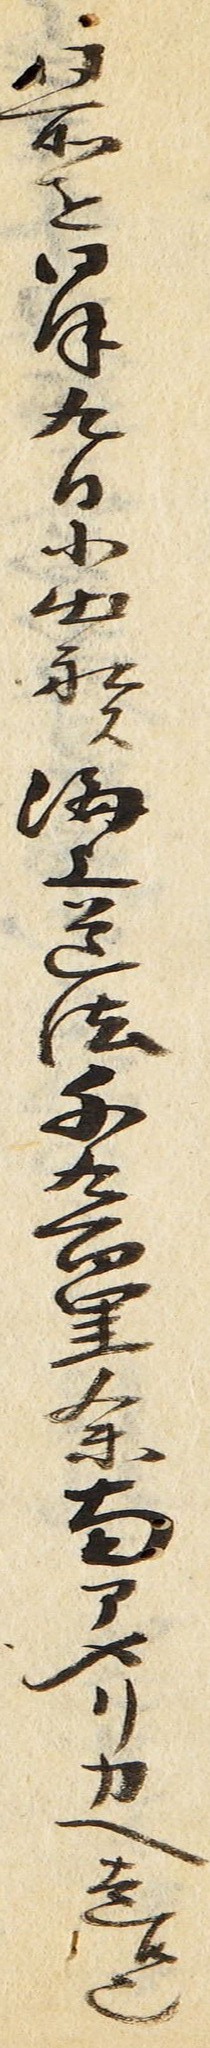同所を四月九日に出船す海上道法千九百里余南アメリカへ走る也
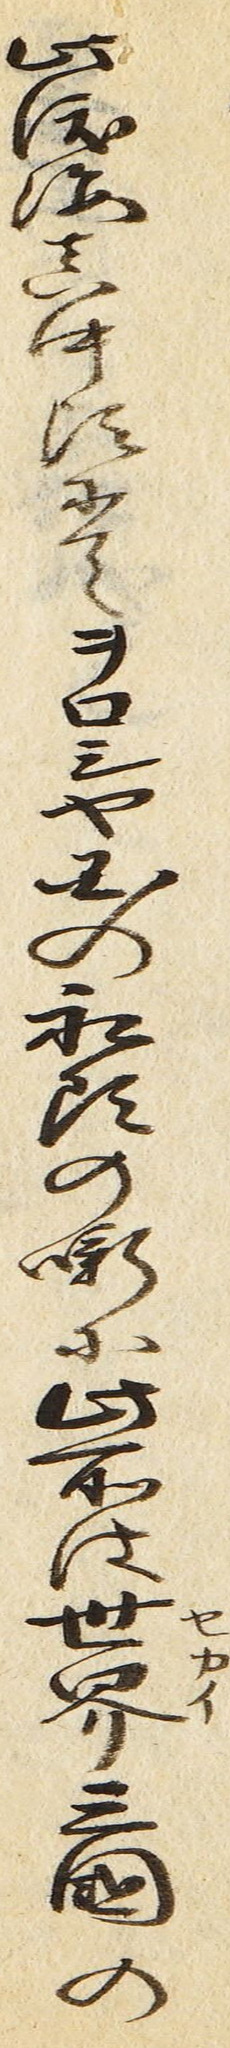此海真中頃にてヲロシヤ国の船頭の噺に此所は世界三国の
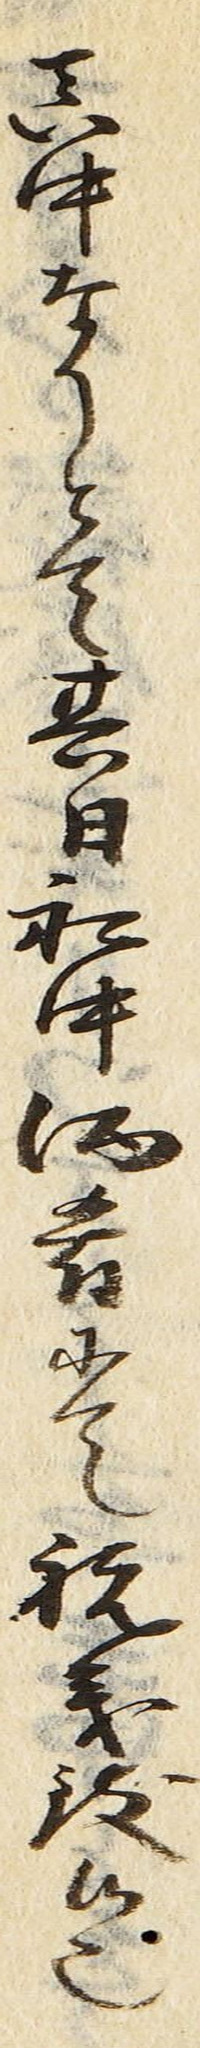真中なりとて其日船中酒肴にて祝義致候也
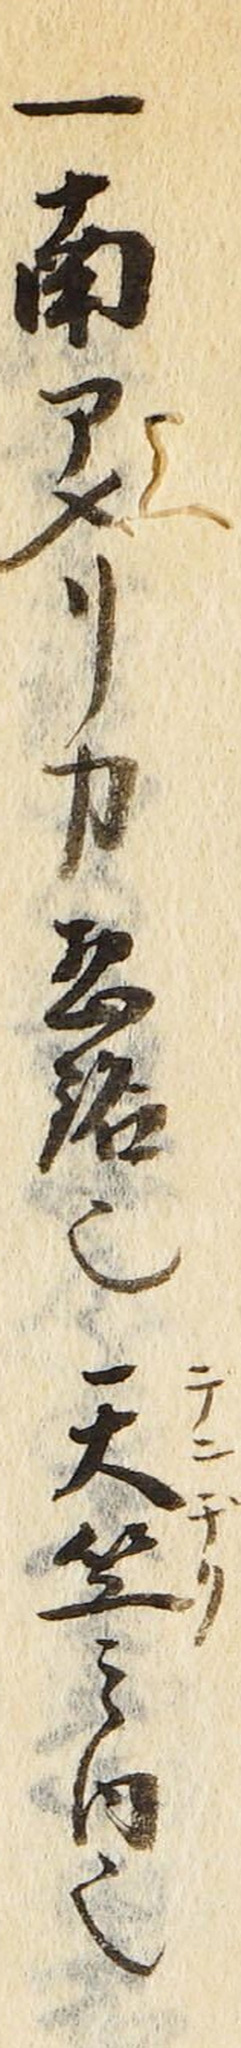一南アメリカ惣銘也天竺之内也
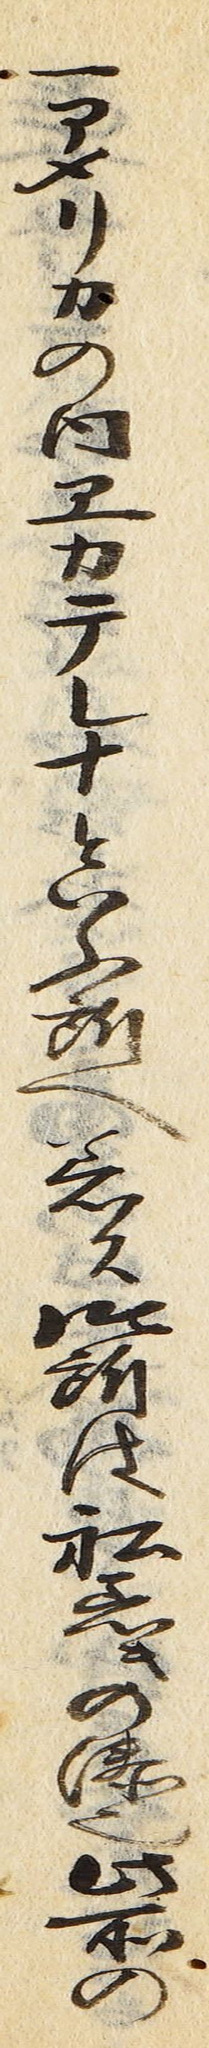一アメリカの内エカテレナといふ所へ着す此所は船着きの湊也此所の
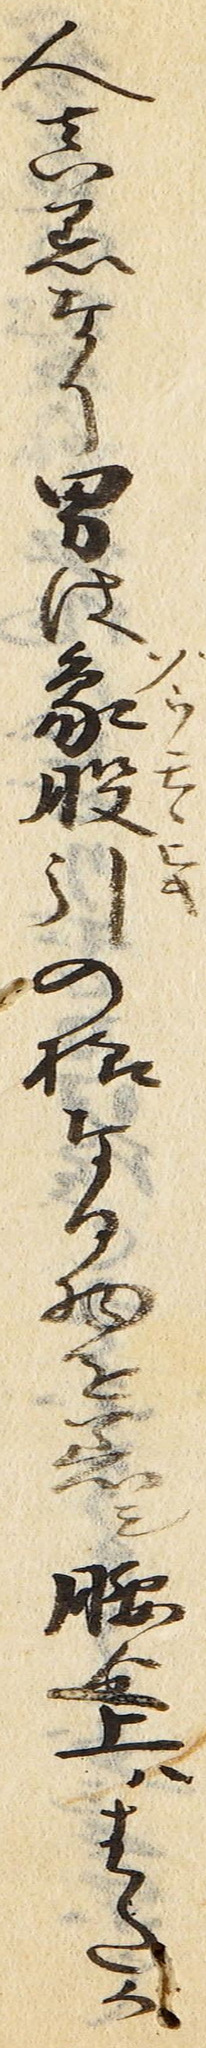人真黒なり男は象股引の様なる物を着し腰ゟ上ははたか
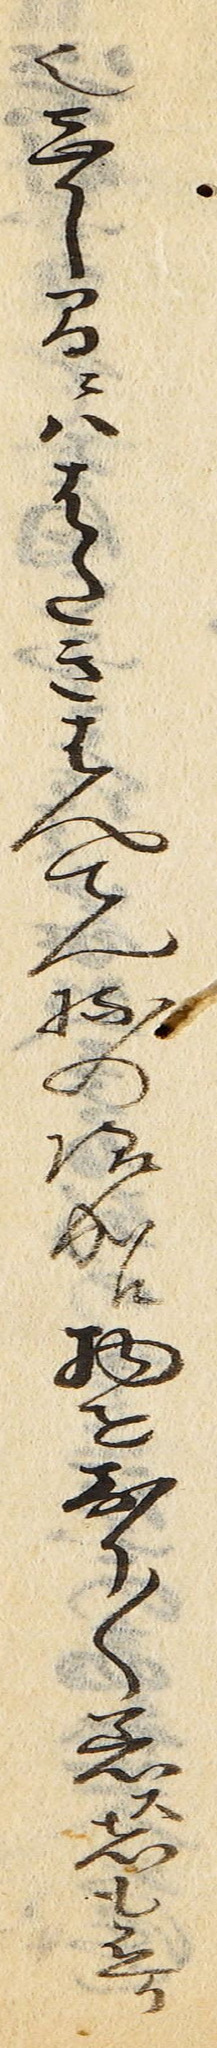也しかし間にははたきはんてん抔の様成る物を寄り〳〵着す者も有り
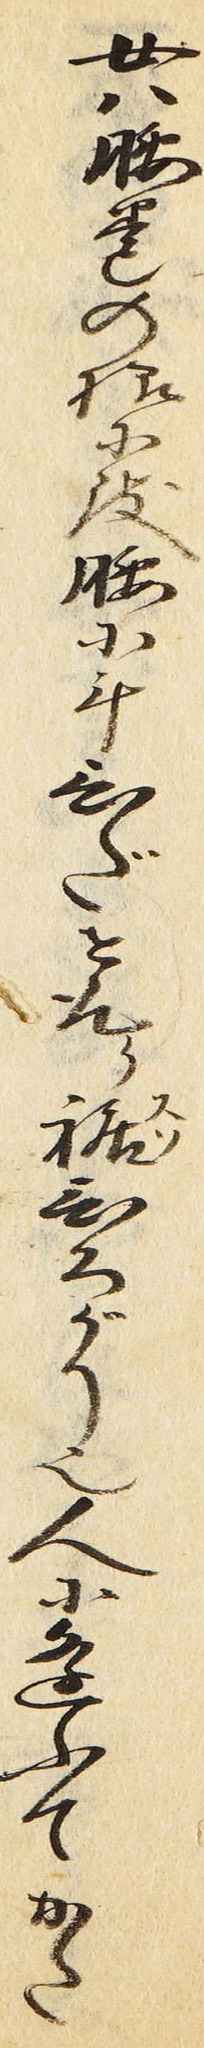女は腰巻の様に致腰に計ひだを取り裾ひろがり也人にあう逢ふてかた
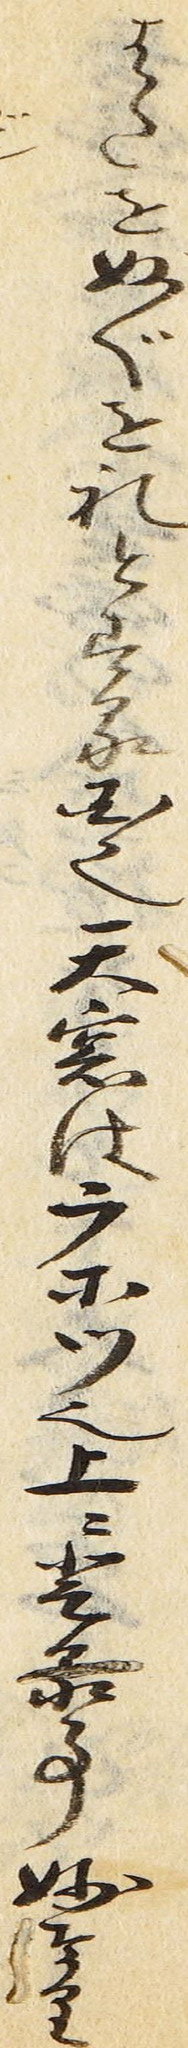はたをぬぐを礼とする国也天窓はラホツ也上に登る事妙なり
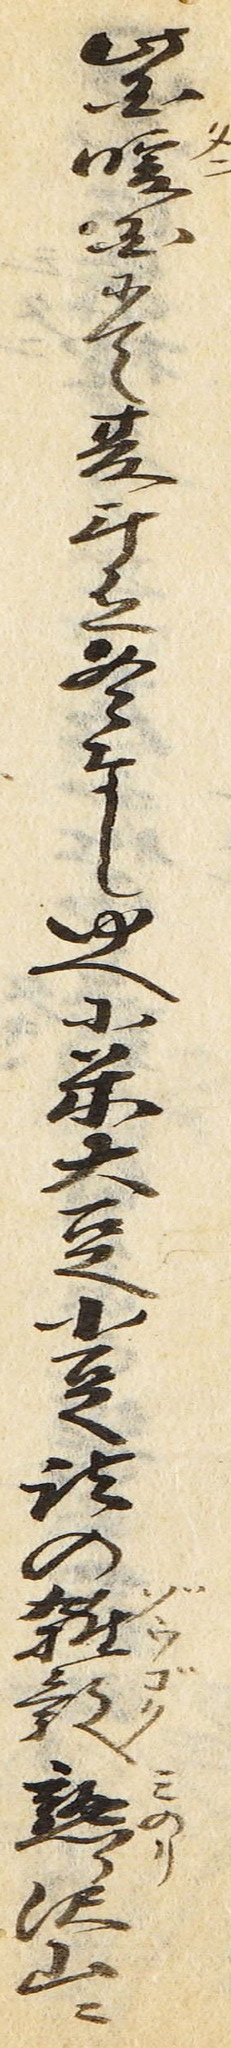此国暖国にて夏計有冬なしゆへに米大豆小豆諸の雑穀熟り沢山に
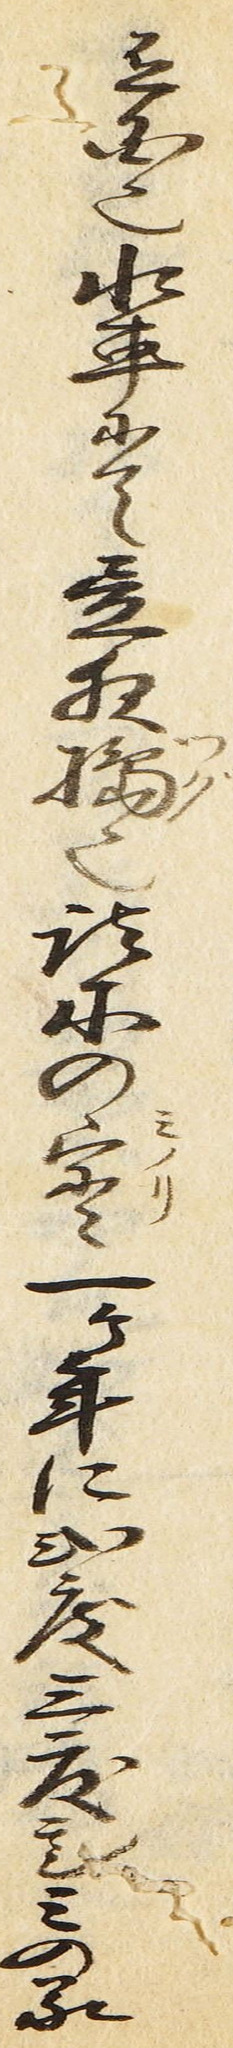有国也水車にて昼夜搗也書諸木の実一ヶ年に弐度三度迄みのる
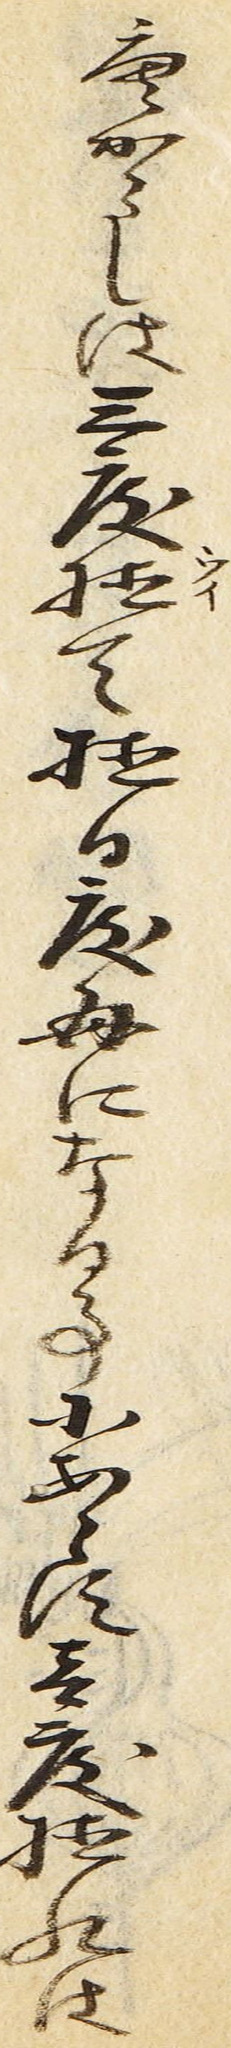唐からしは三度植て植る度毎になる事にあらす壱度植れは
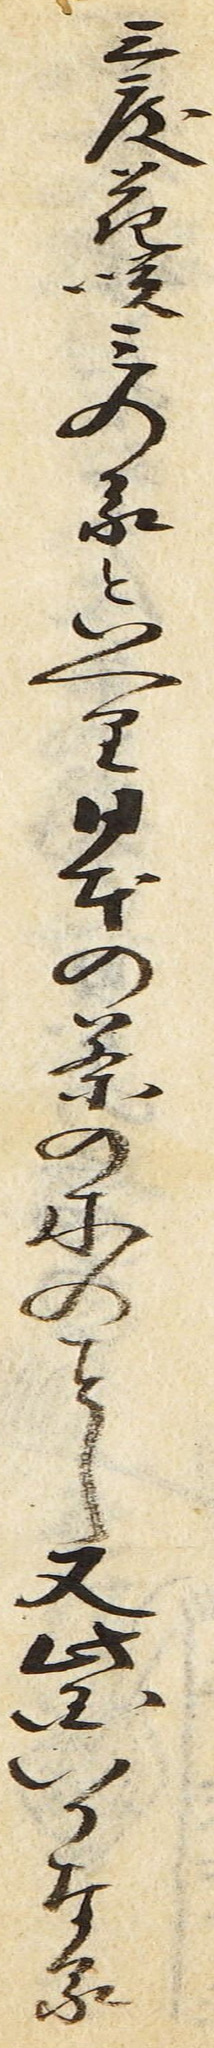三度花咲みのるといへり日本の茶の木のことし又此国いかなる
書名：外国漂流記
